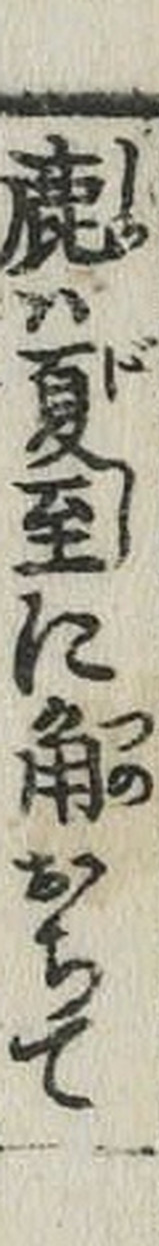鹿は夏至に角おちて
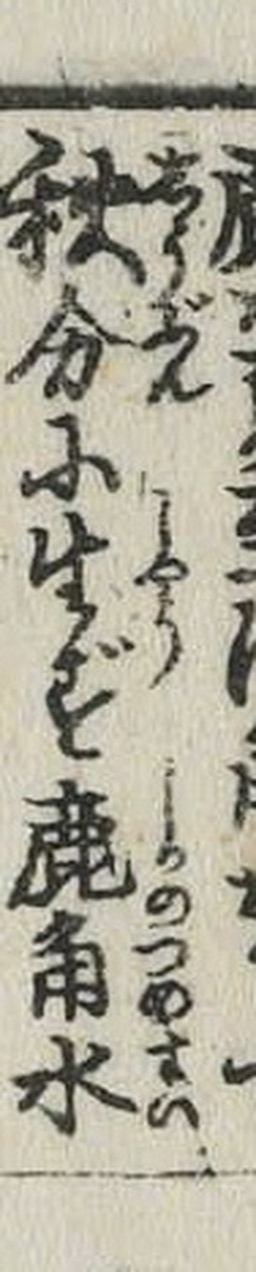秋分に生ず鹿角水
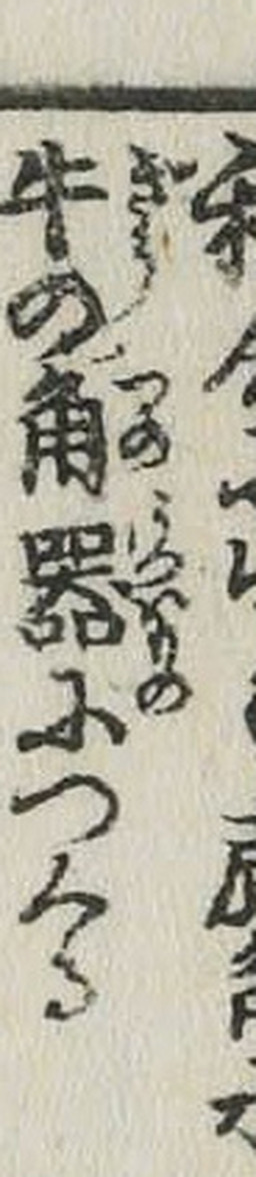牛の角器につくる
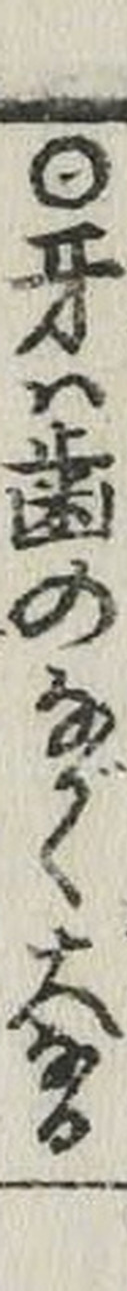○牙は歯のながく大なる
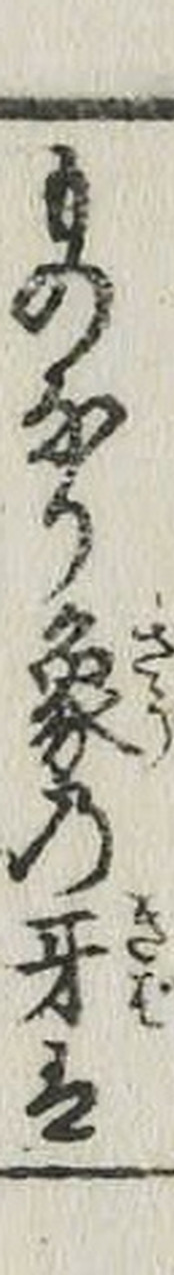ものなり象の牙は
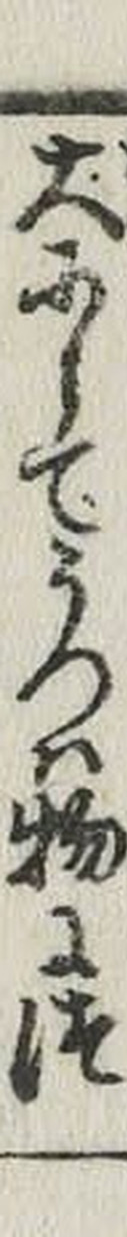大にしてうつは物につ
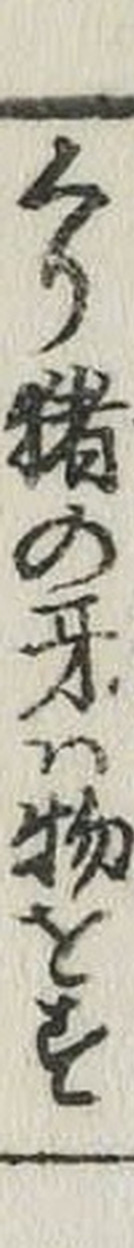くり猪の牙は物をす
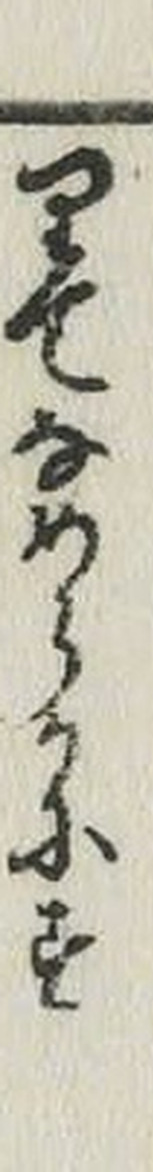りてなめらかにす
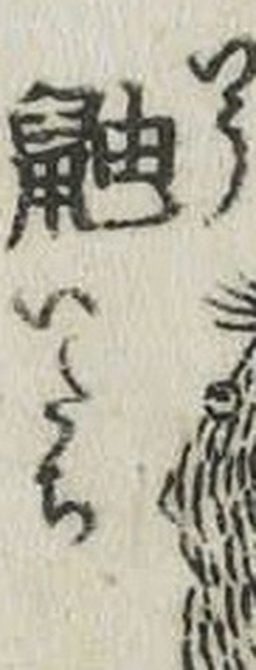鼬いたち
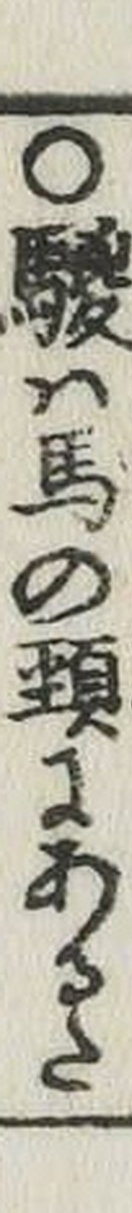○騣は馬の頸にあるた
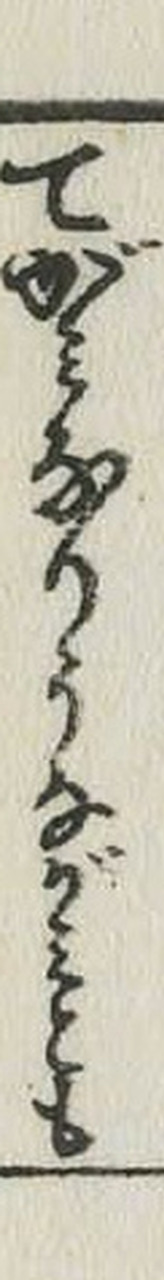てがみなりうながみとも
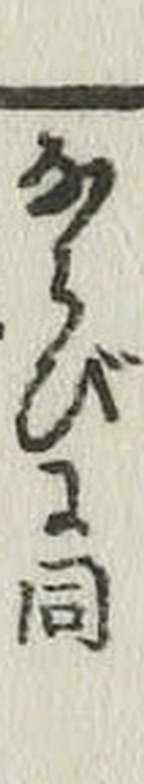ならびに同
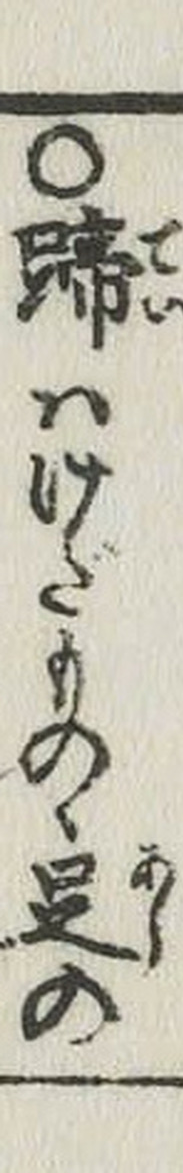○蹄はけだものゝ足の
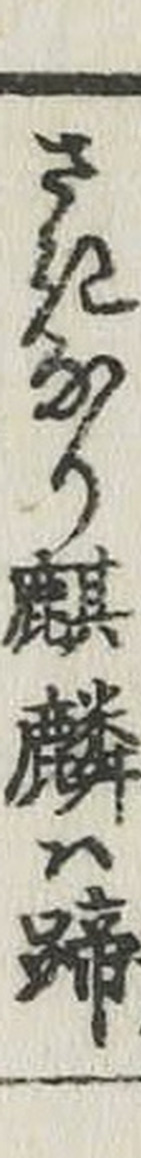さきなり麒麟は蹄
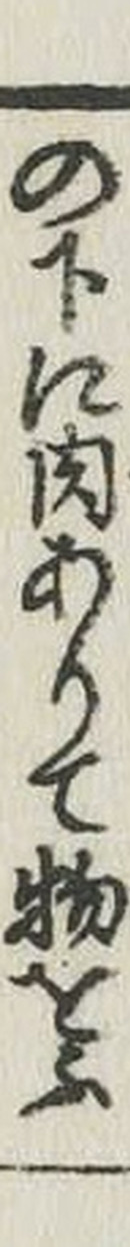の下に肉ありて物をふ
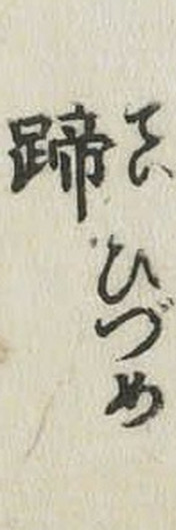蹄ひづめ
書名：増補頭書訓蒙図彙大成 10巻 6:巻之12-13
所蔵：東京学芸大学教育コンテンツアーカイブ
